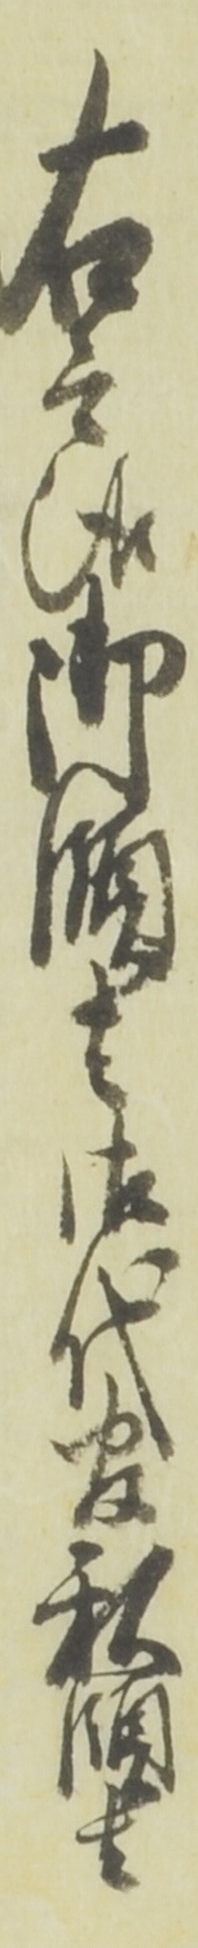右之趣御領は御代官私領は
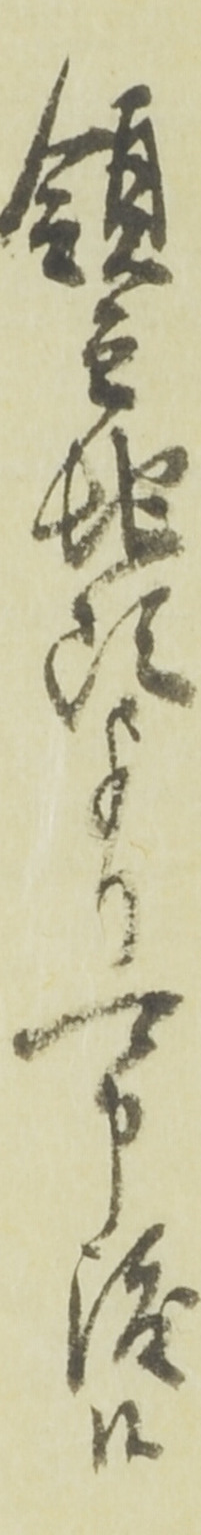領主地頭より可申渡候
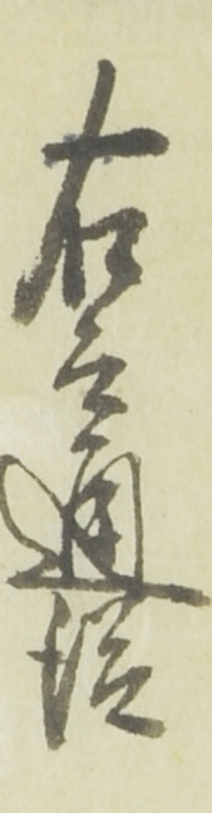右之通従
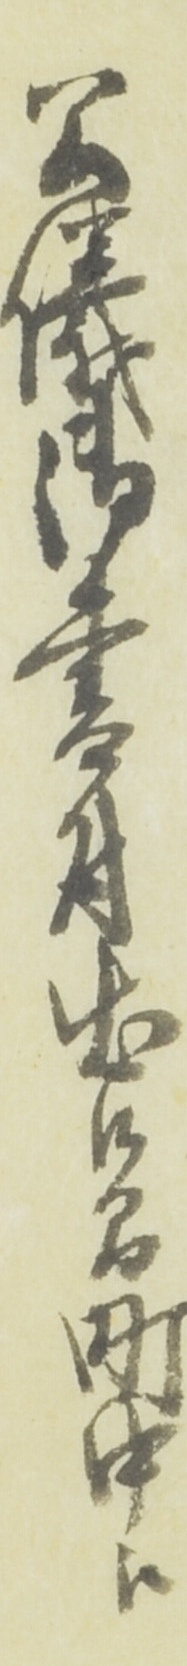公儀御書付出候間町中江
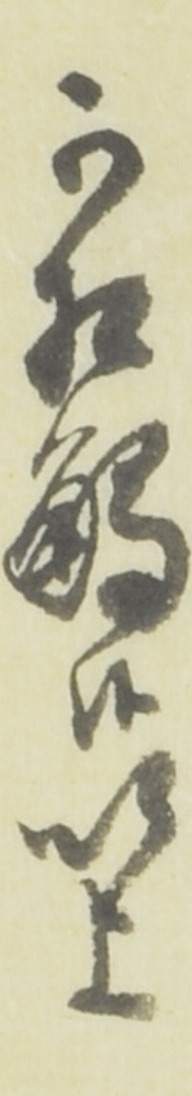可相触候以上
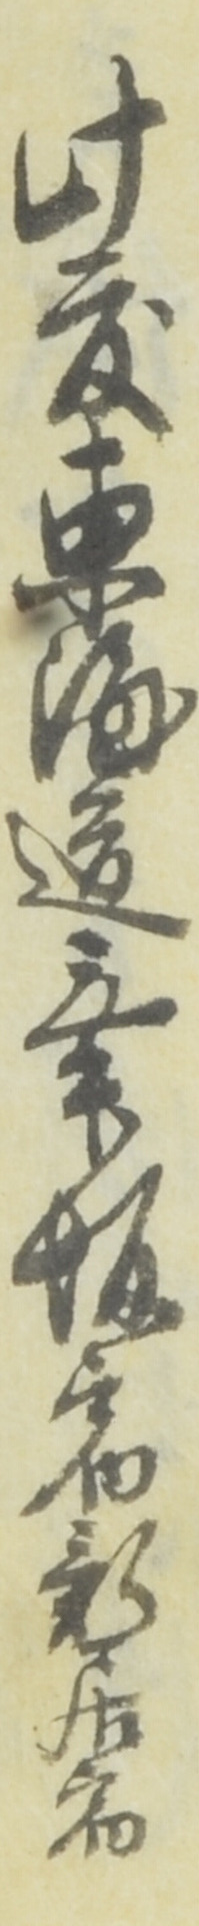此度東海道舞坂宿新居宿
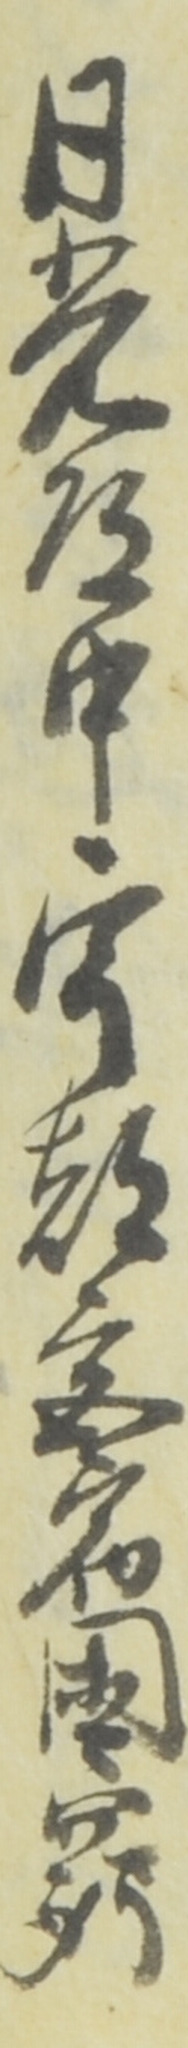日光道中宇都宮宿困窮

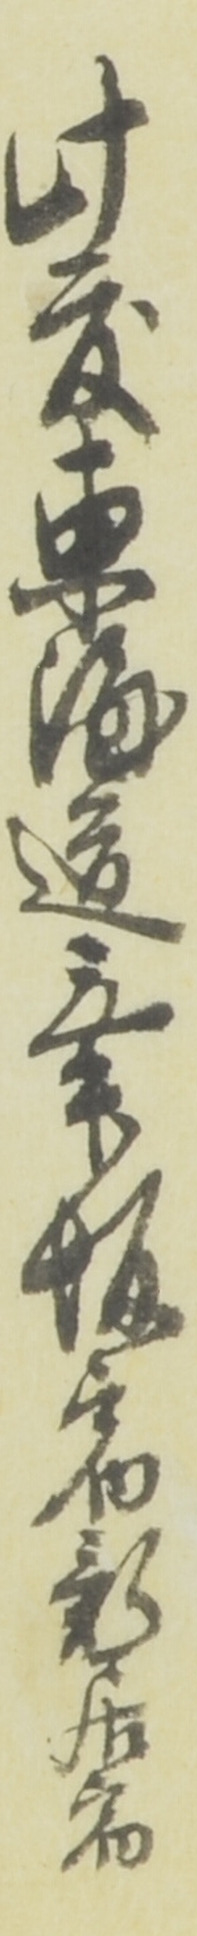此度東海道舞坂宿新居宿
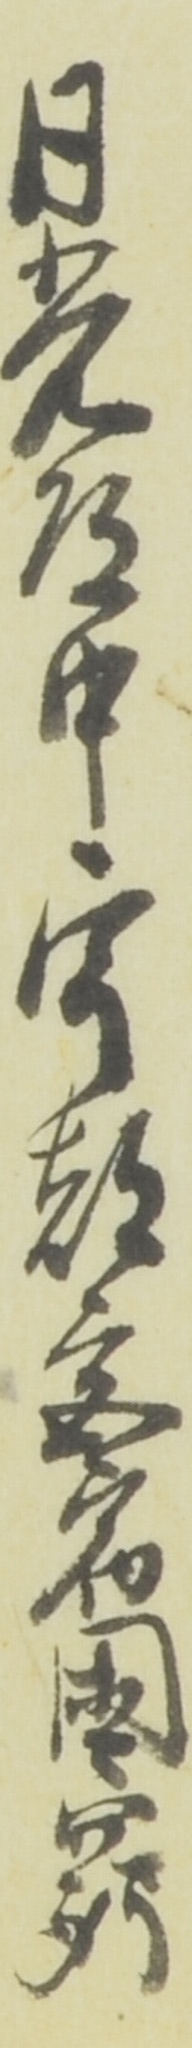日光道中宇都宮宿困窮
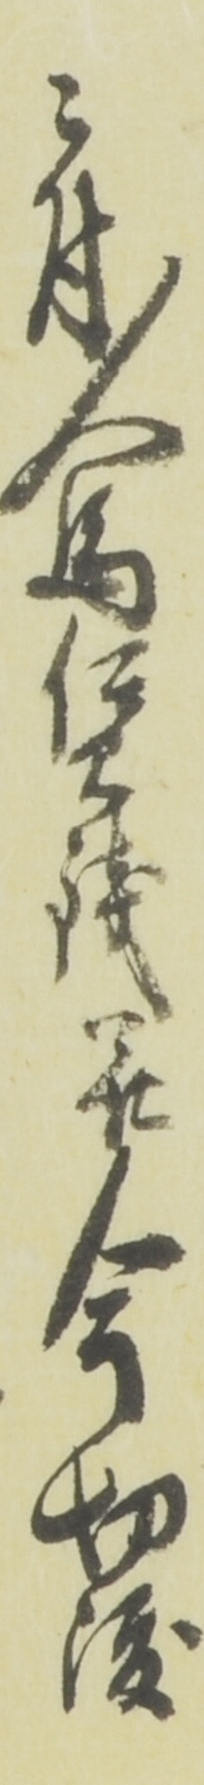ニ付人馬賃銭并今切渡
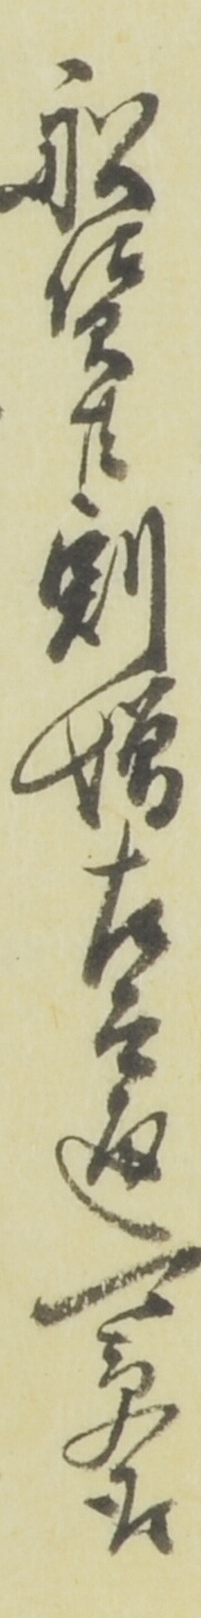船賃共割増左之通可受取
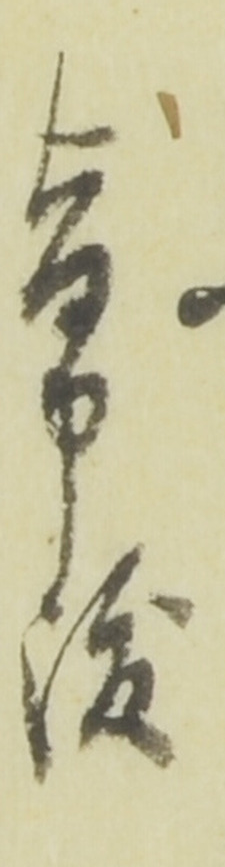旨申渡
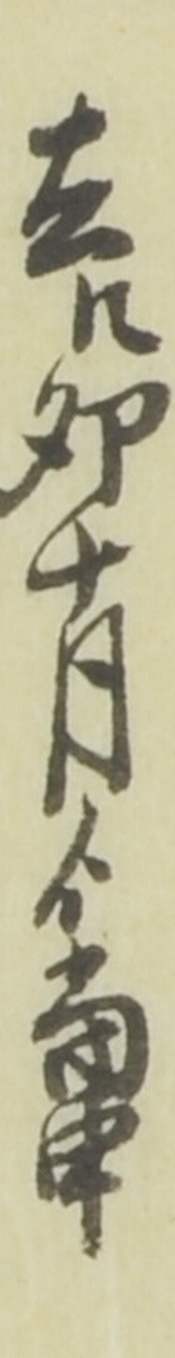去ル卯十月ゟ当申
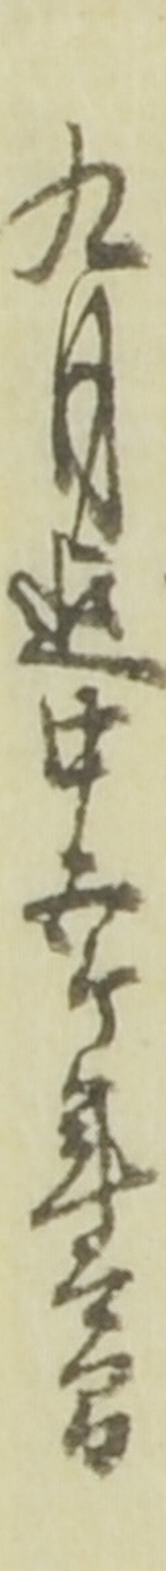九月迄中五ヶ年之間
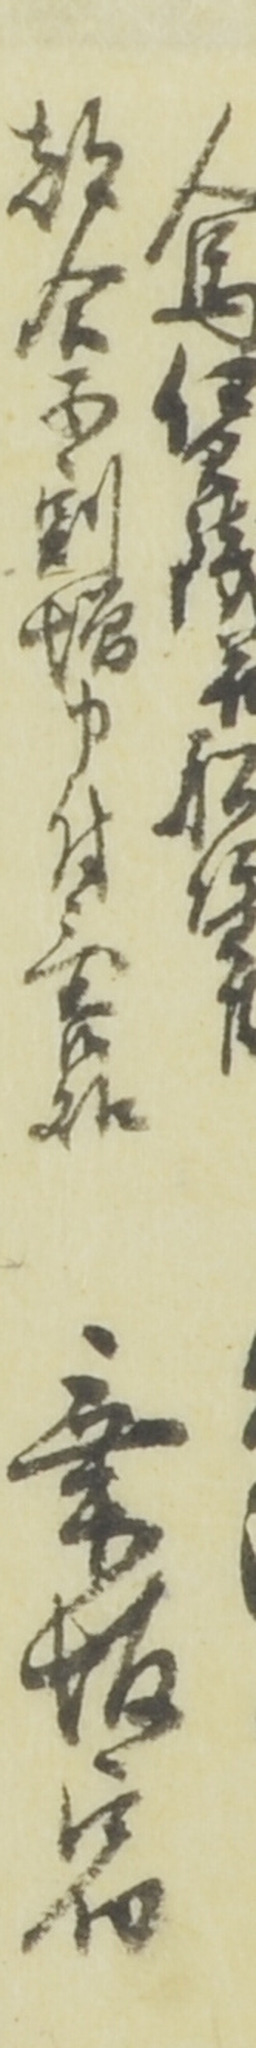都合五割増申付置候処舞坂宿
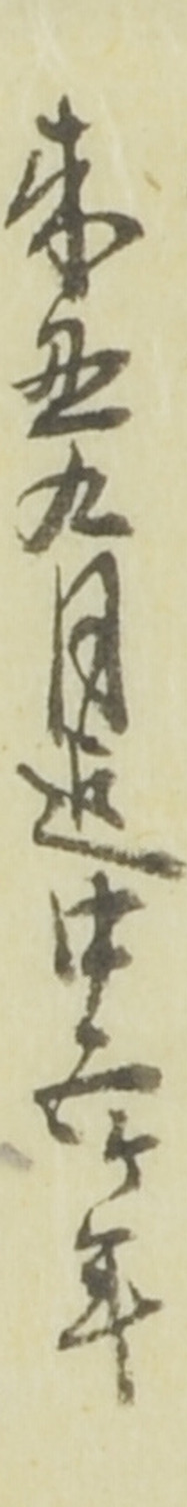来丑九月迄中五ヶ年
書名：御触書御書附控
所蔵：伊那市立高遠町図書館・合同会社AMANE
